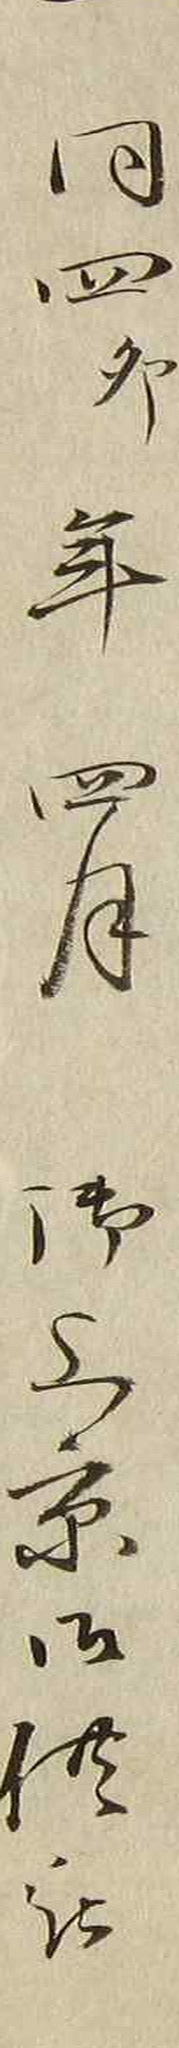一同四卯年四月御上京御供被
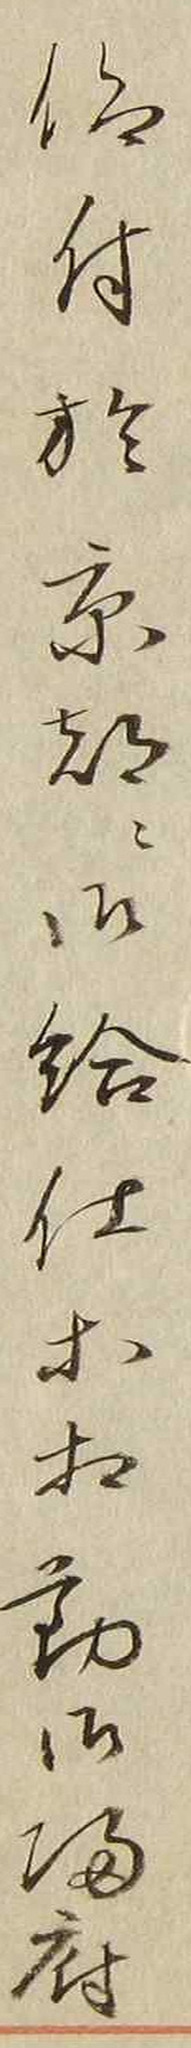仰付於京都御給仕等相勤御帰府
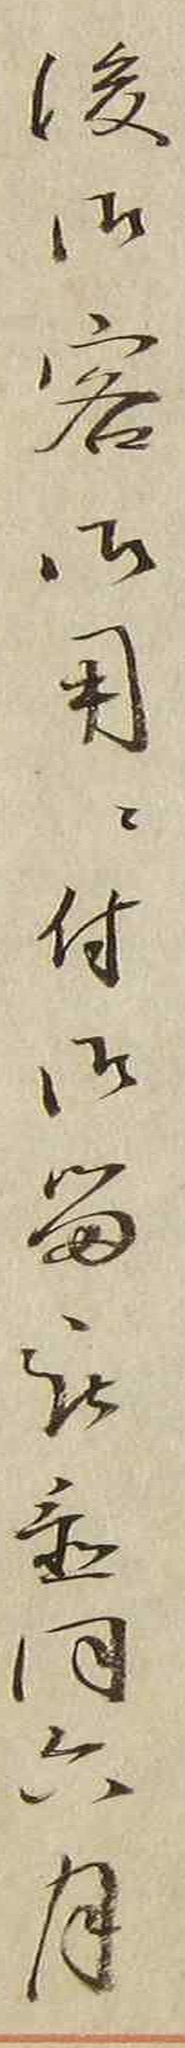後御客御用ニ付御留被置同六月

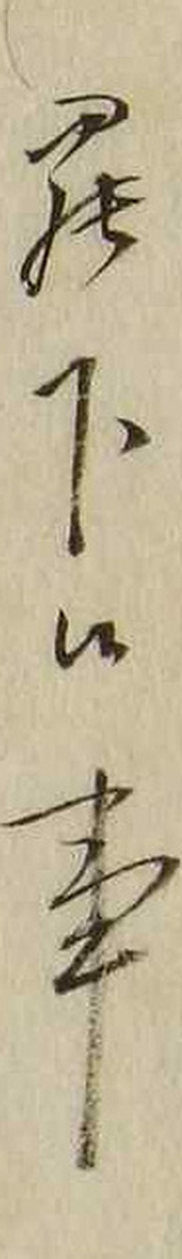罷下候事
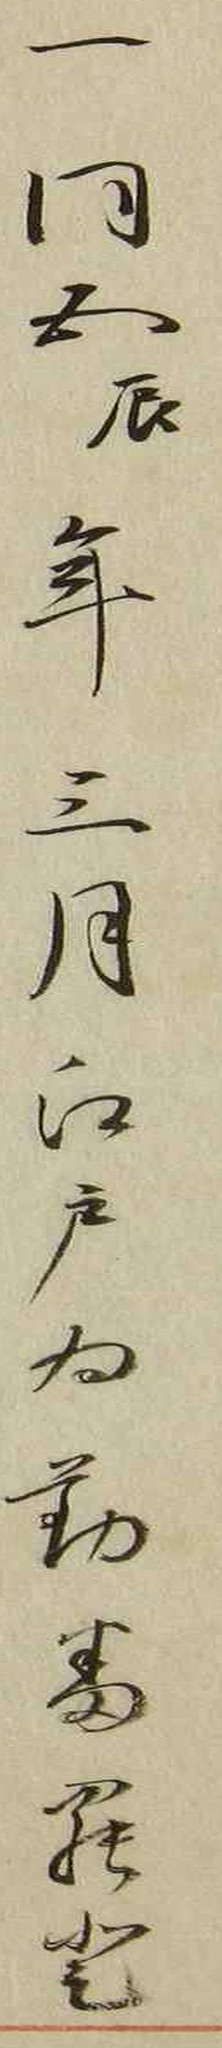一同五辰年三月江戸為勤番罷登
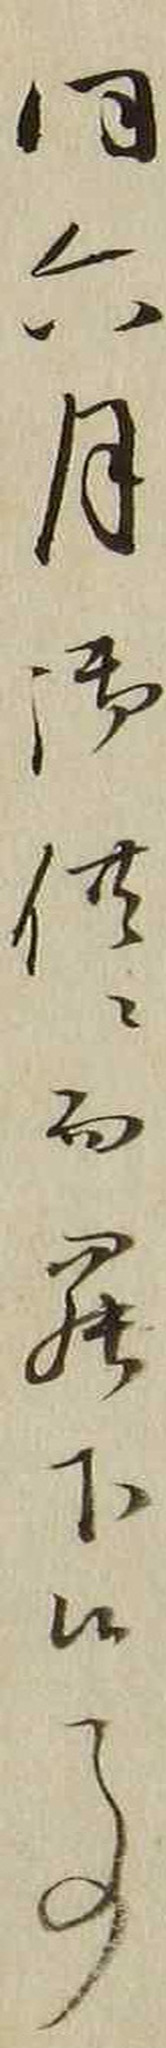同六月御供ニ而罷下候事
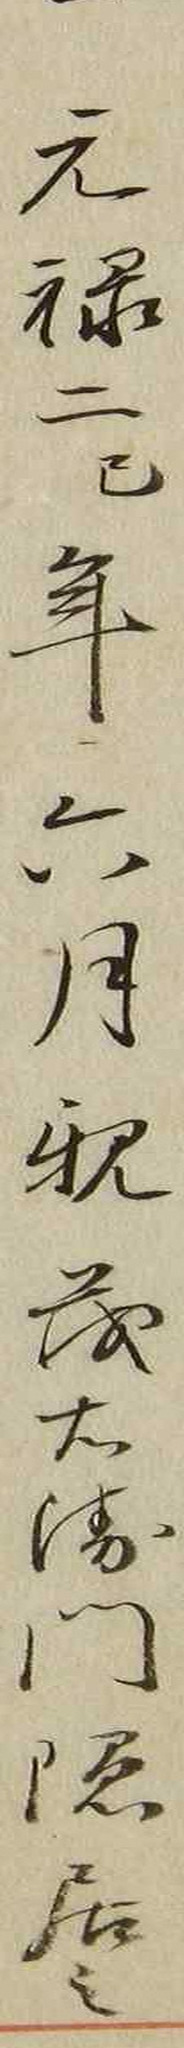一元禄二巳年六月親茂右衛門隠居之
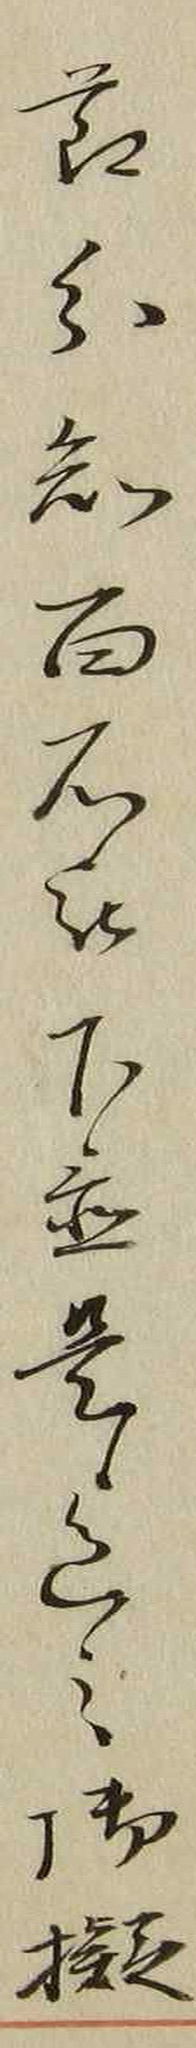節分知百石被下置是迄之御擬
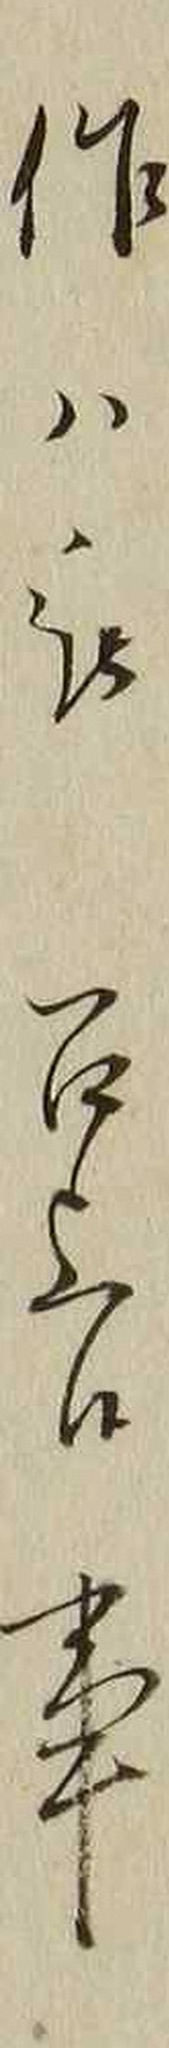作ハ被召上候事
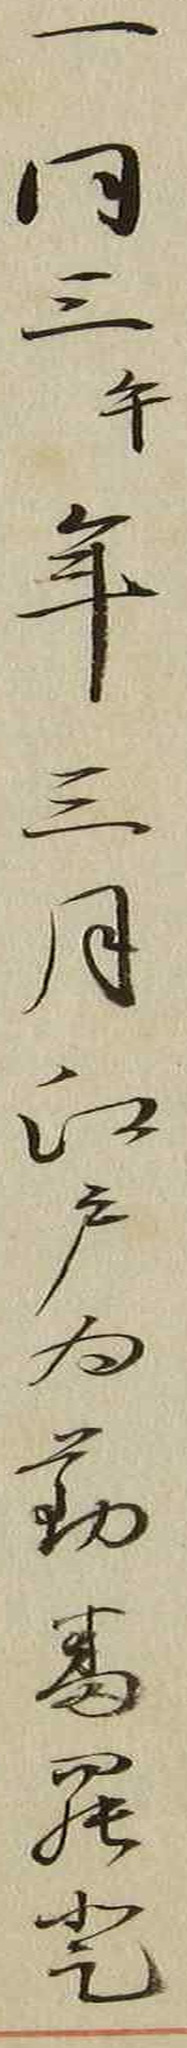一同三午年三月江戸為勤番罷登
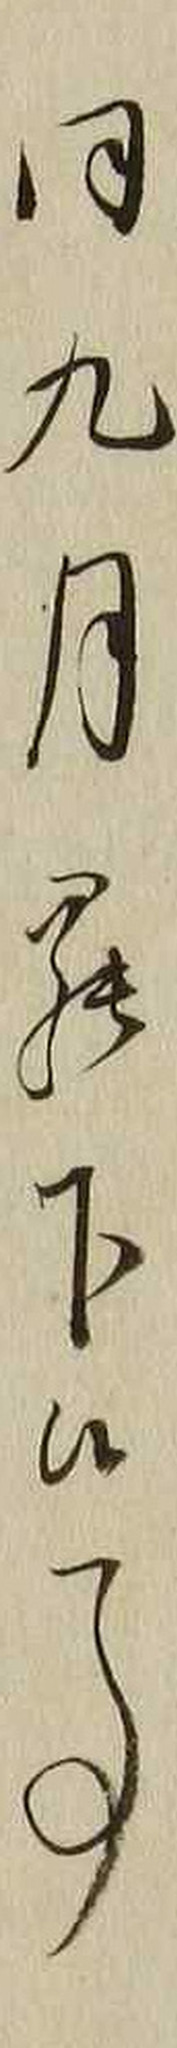同九月罷下候事
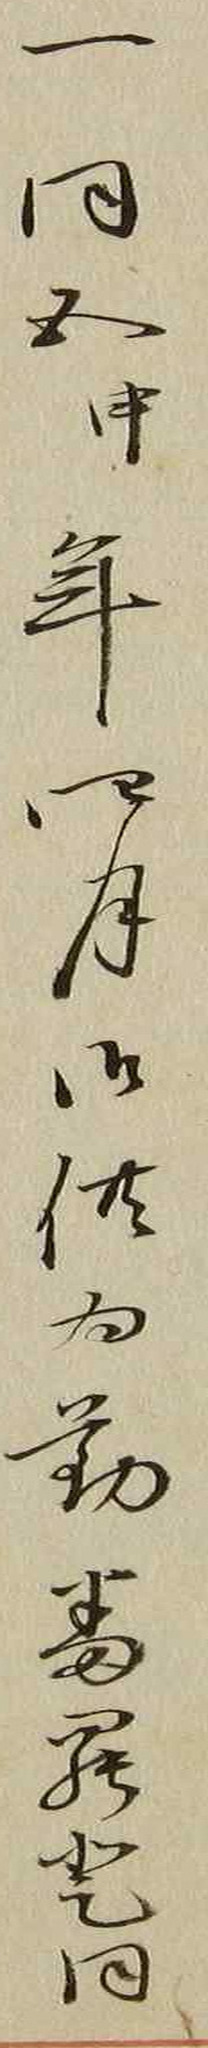一同五申年四月御供為勤番罷登同
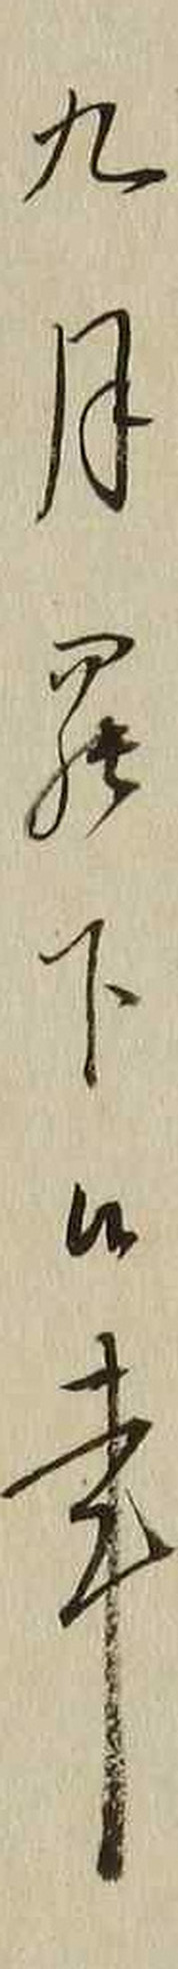九月罷下候事
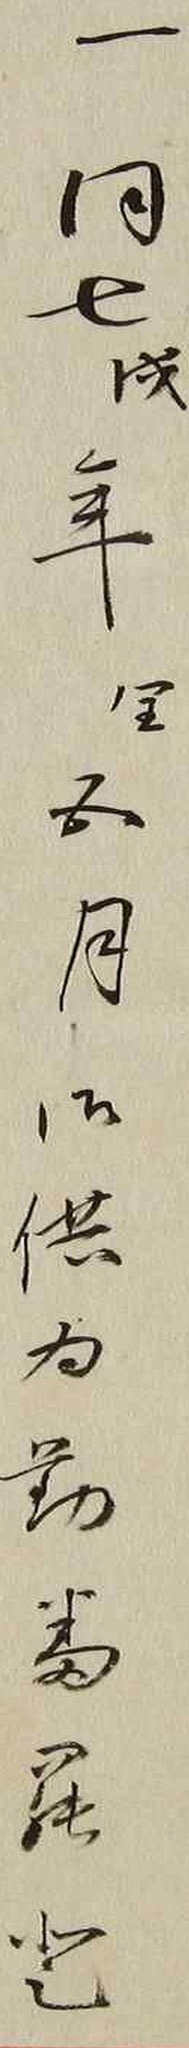一同七戌年閏五月御供為勤番罷登
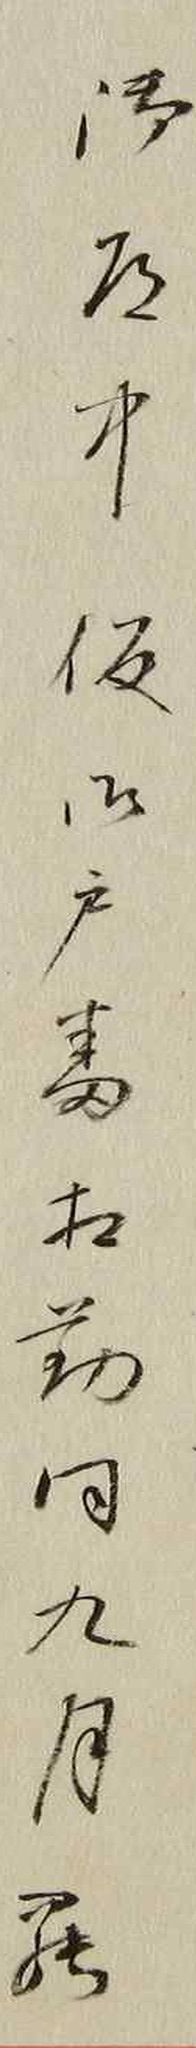御道中仮御戸番相勤同九月罷
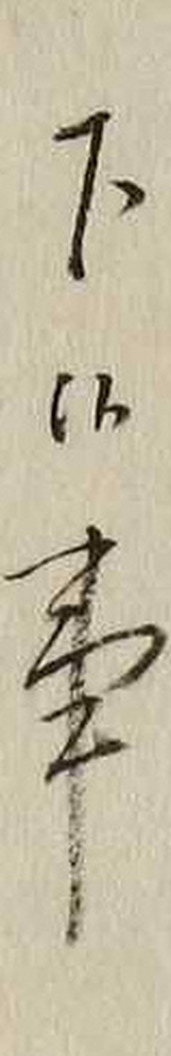下候事
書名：諸士系譜　巻之22　い之部22
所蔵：会津若松市立会津図書館
